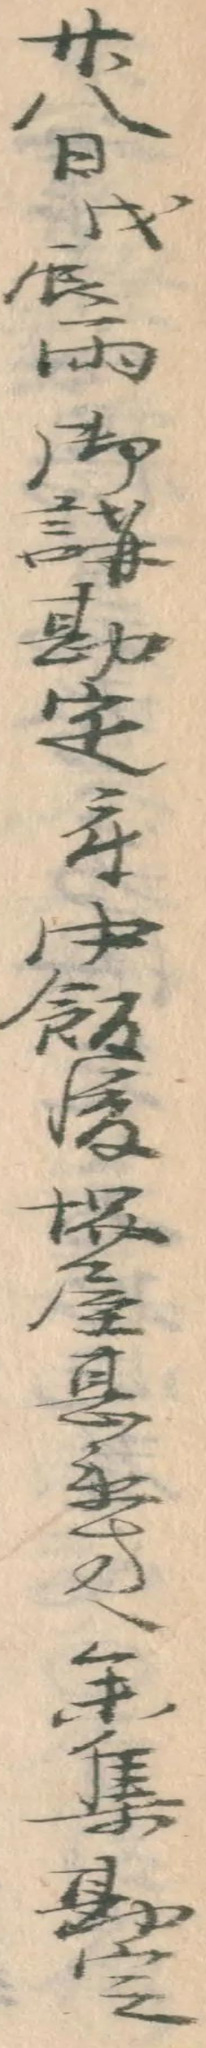廿八日戊辰雨御講勘定ニ付中飯後堺屋甚兵衛方へ参集勘定
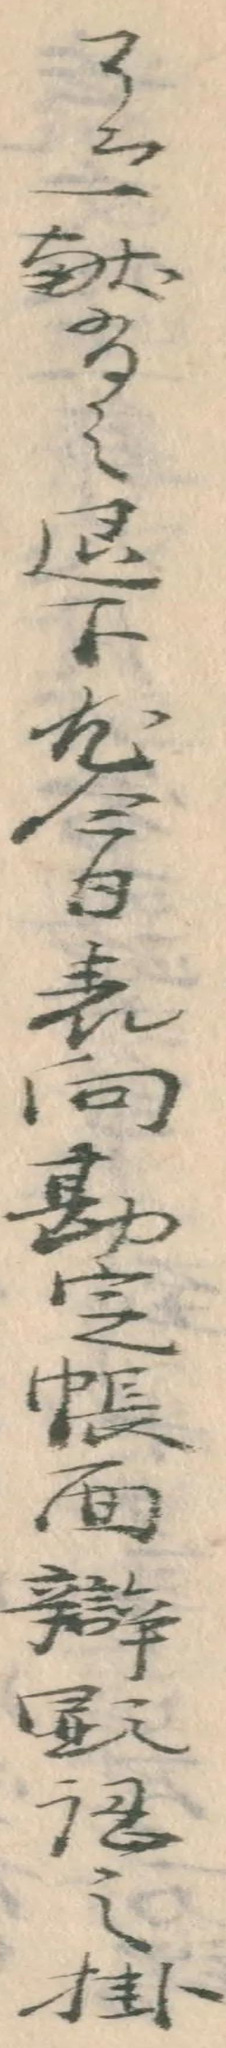了而一献有之退下尤今日表向勘定帳面弁顕認之掛
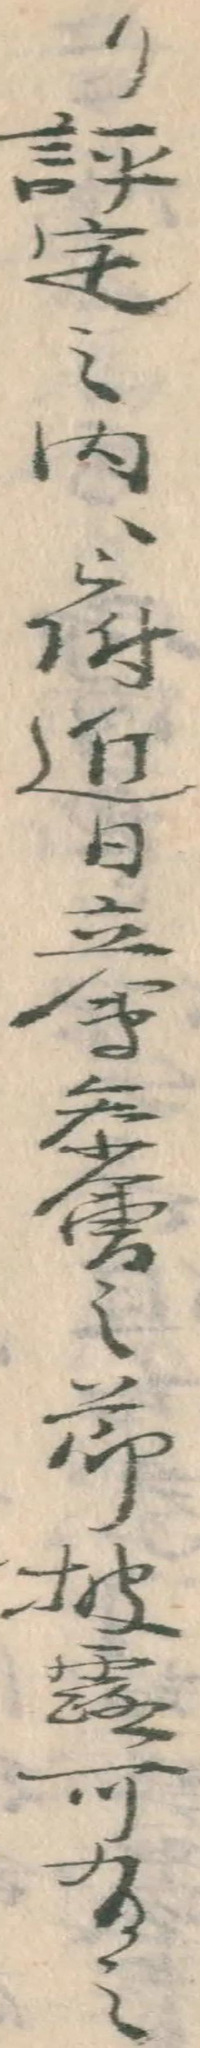り評定之内へ被附近日立会参会之節披露可有之
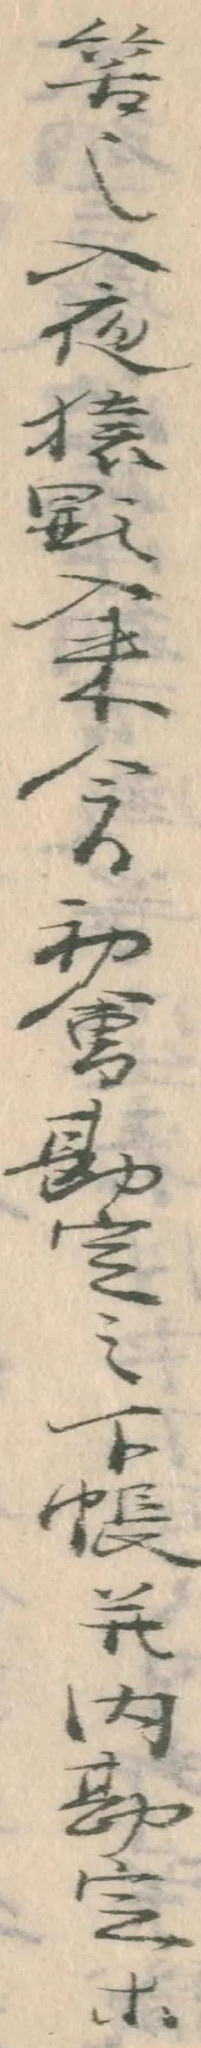筈也入夜猿顕入来今日初会勘定之下帳并内勘定等
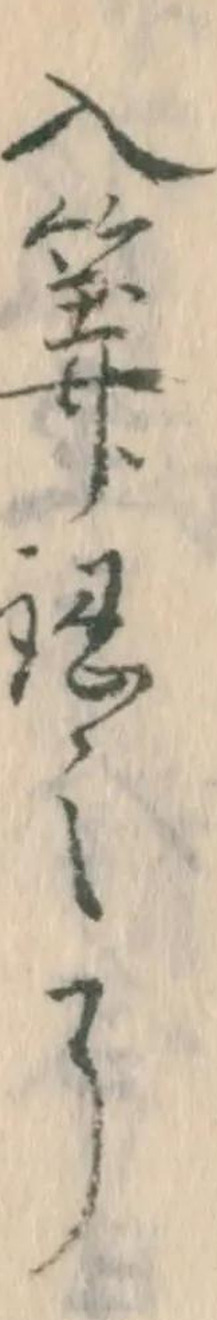入算認之了
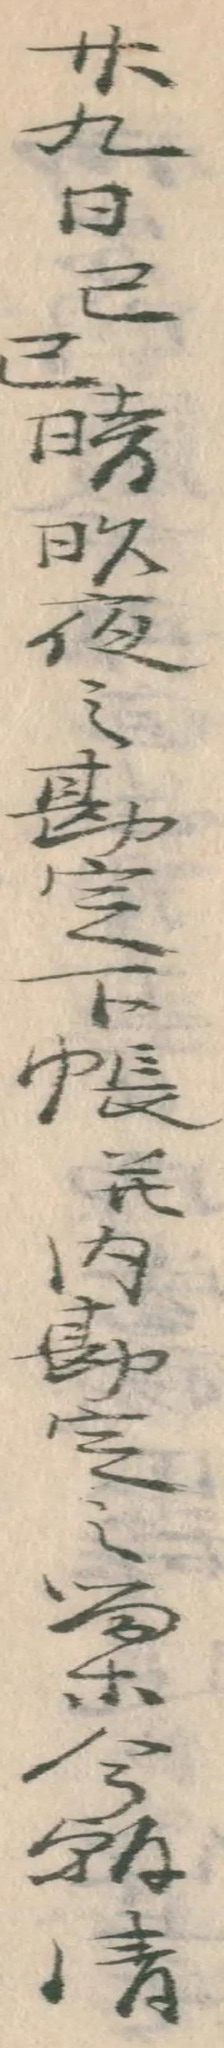廿九日己巳晴昨夜之勘定下帳并内勘定之留等今朝清
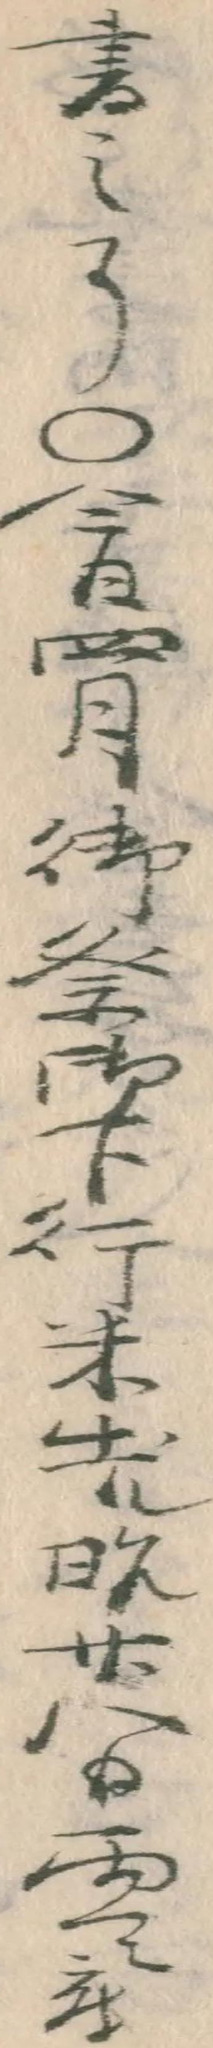書之了○今日四月御祭御下行米出ル昨廿八日雨天ニ付
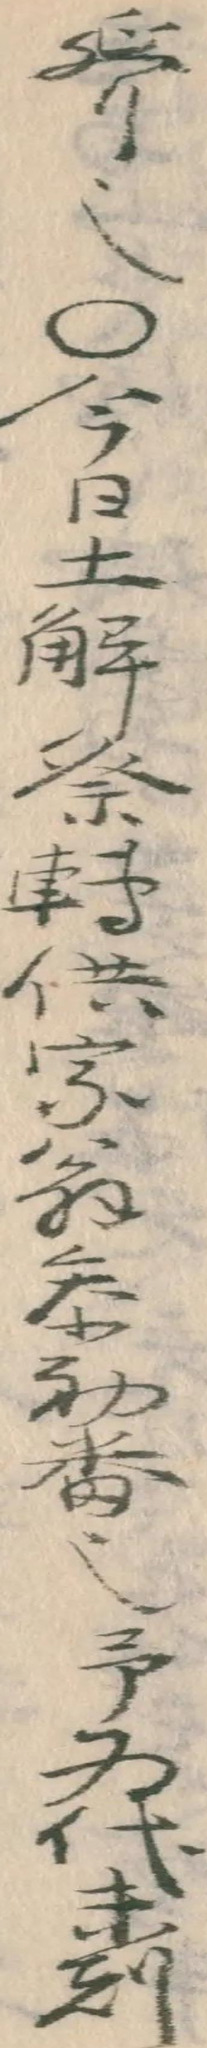延引也○今日土解祭転供家翁参勤番也予為代未刻
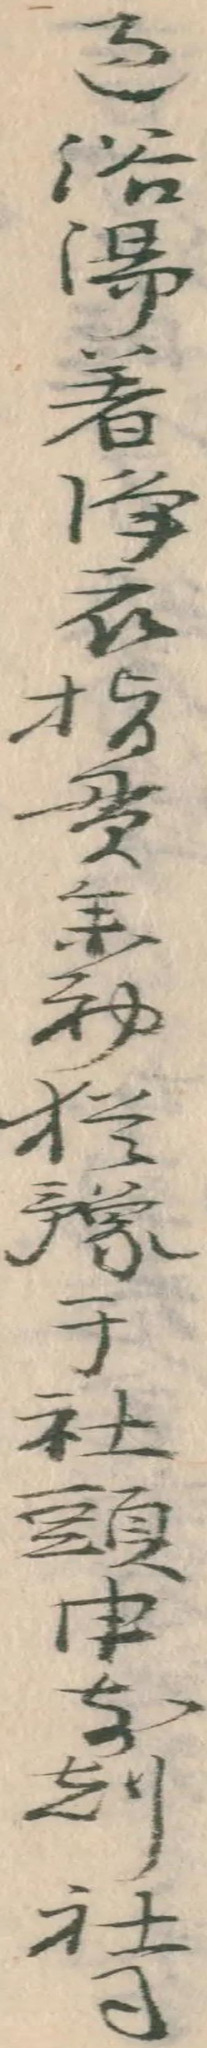過浴湯着浄衣指貫参勤猶予于社頭申前刻社司
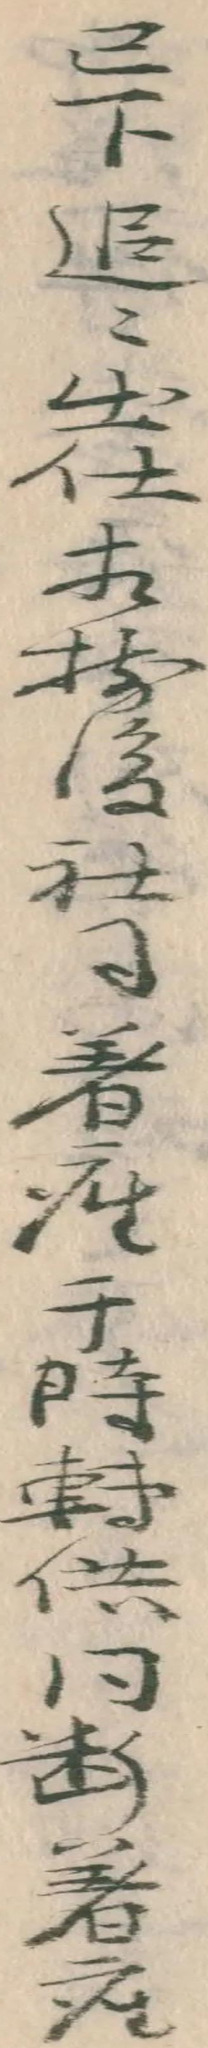已下追々出仕相揃後社司着座于時転供同断着座
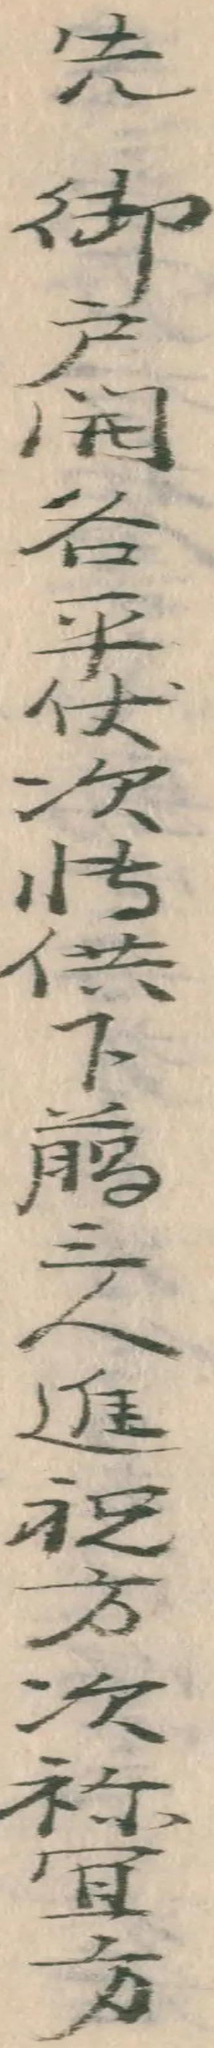先御戸開各平伏次転供下臈三人進祝方次祢宜方
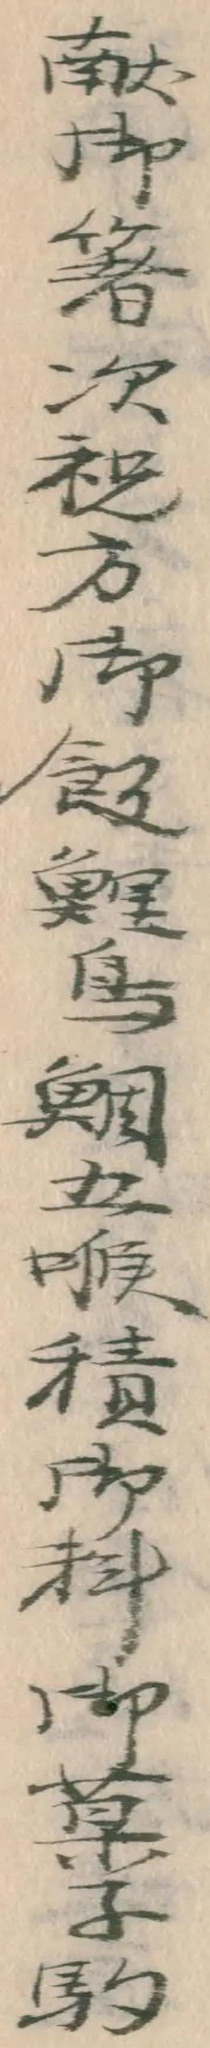献御箸次祝方御飯鯉鳥鯛五喉積御料御菓子駒
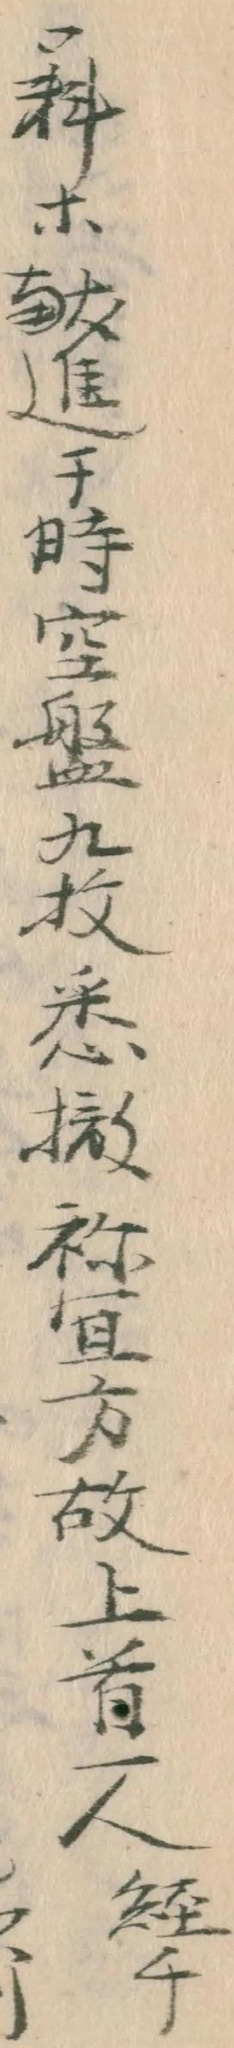御料等献進于時空盤九枚悉撤祢宜方故上首一人経千
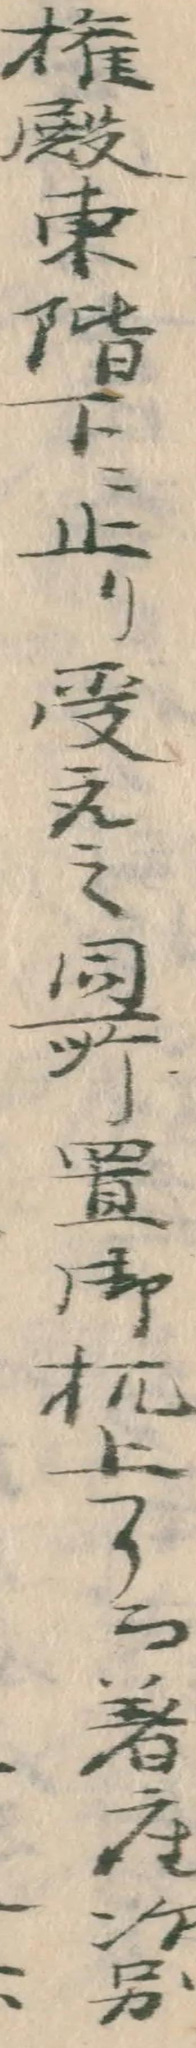権殿東階下に止り受取之同所置御机上了而着座次別
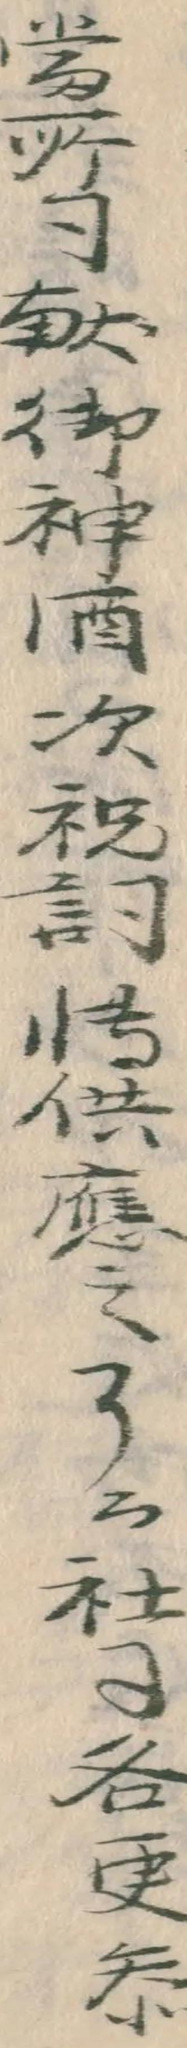当所司献御神酒次祝詞転供応之了而社司各更参
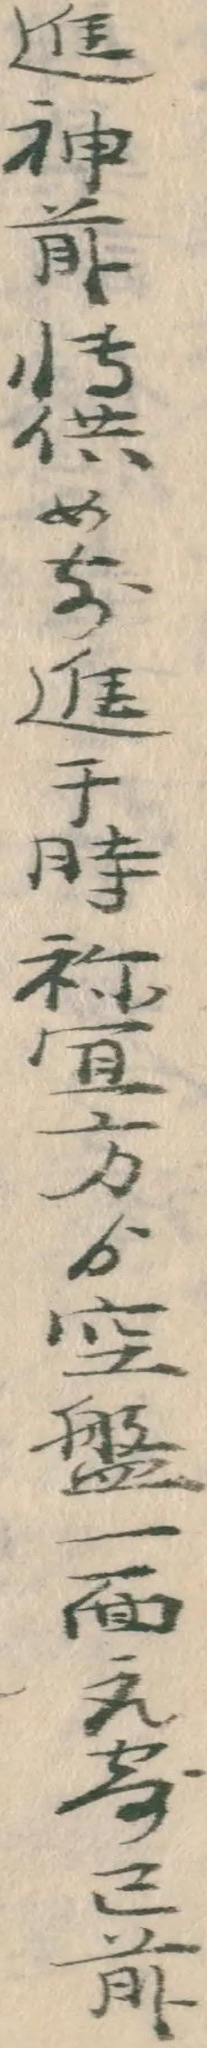進神前転供如前進于時祢宜方ゟ空盤一面取寄已前
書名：賀茂社記録. 第64冊
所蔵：国立国会図書館 National Diet Library, JAPAN
